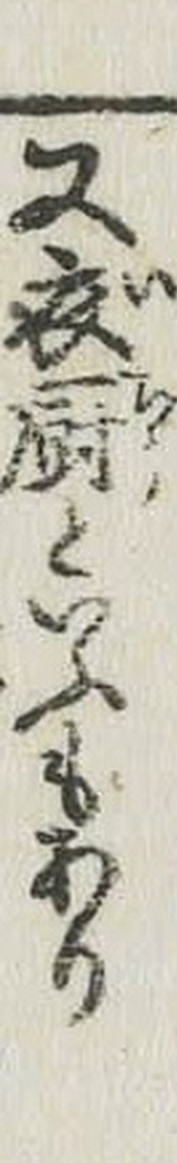又衣厨といふもあり
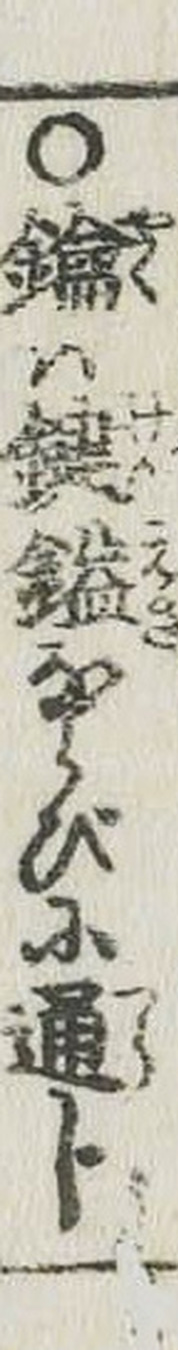○鑰は鍵鎰ならびに通じ
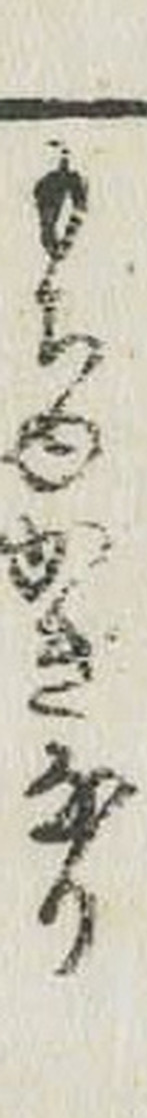もちゆかぎなり
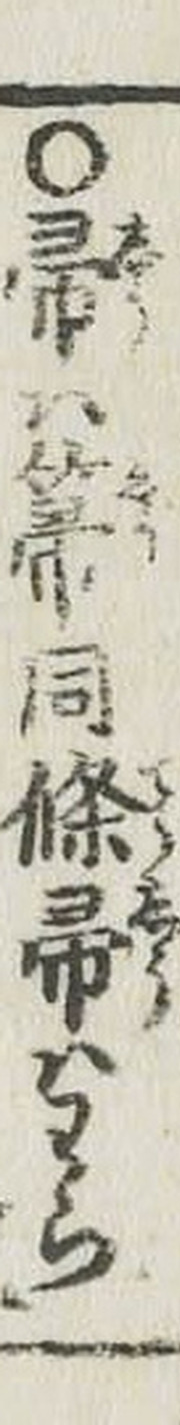○帚は箒同條帚はわら
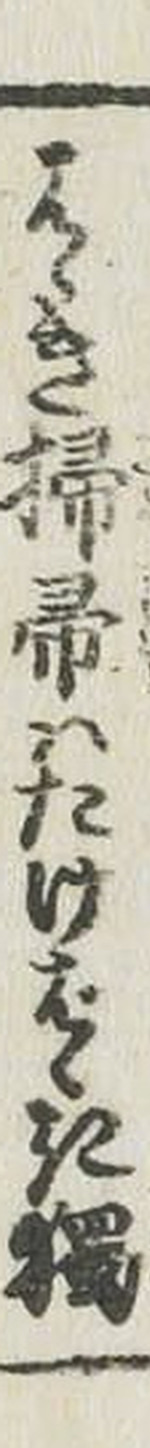はゝき掃帚はたけばゝき独
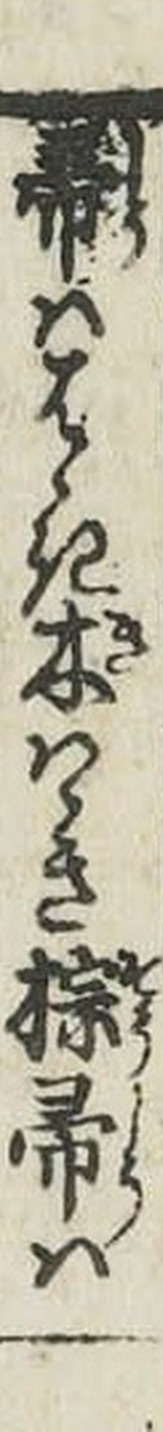帚ははゝき木はゝき棕帚は
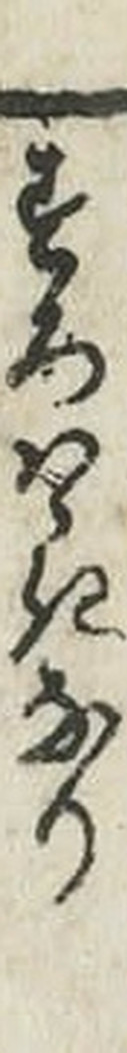すろはゝきなり
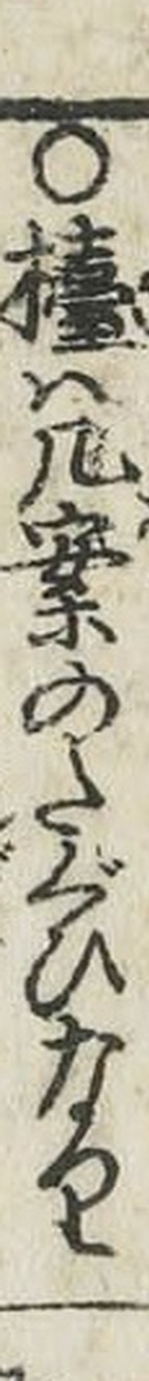○檯は几案のたぐひなり
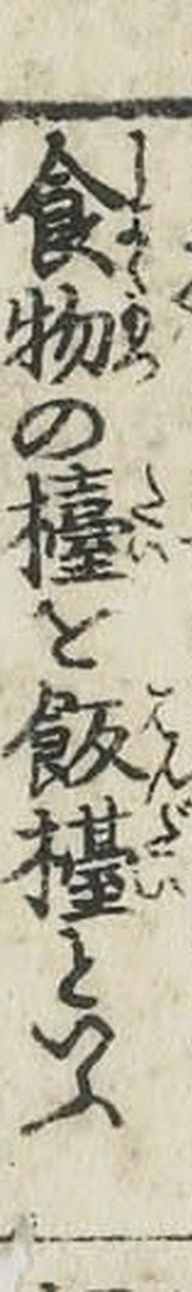食物の檯を飯檯といふ
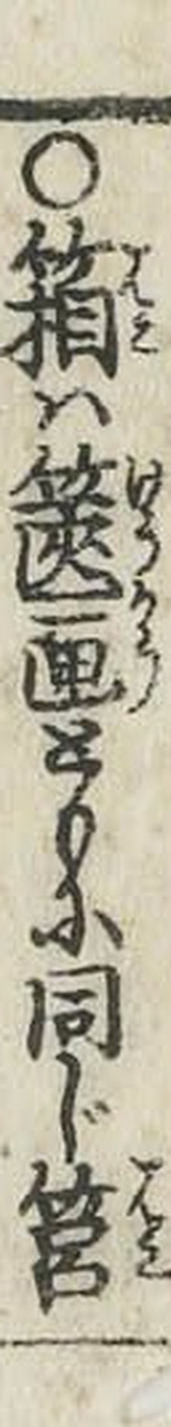○箱は篋匣ともに同じ筥
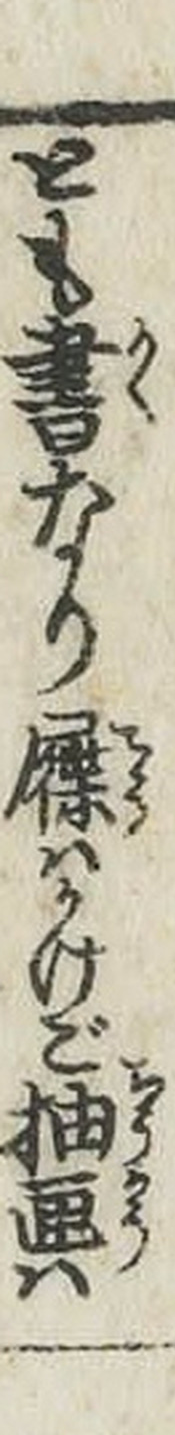とも書なり屧はかけご抽匣は
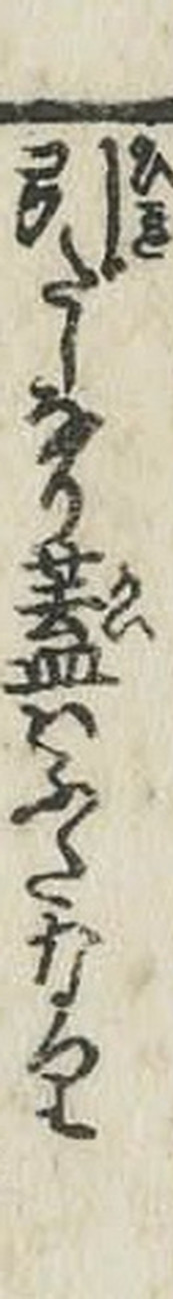引だしなり蓋はふたなり
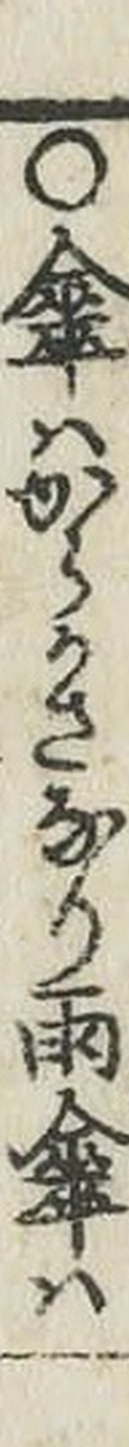○傘はからかさなり雨傘は
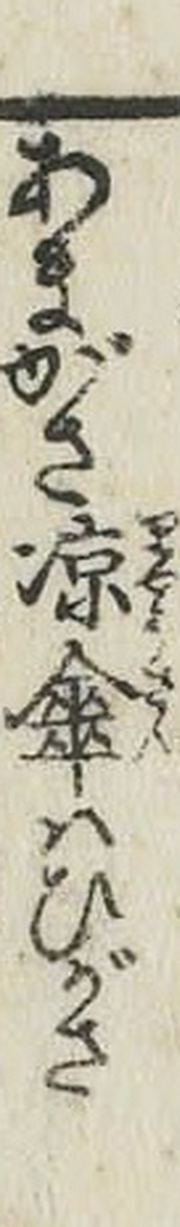あまがさ凉傘はひがさ
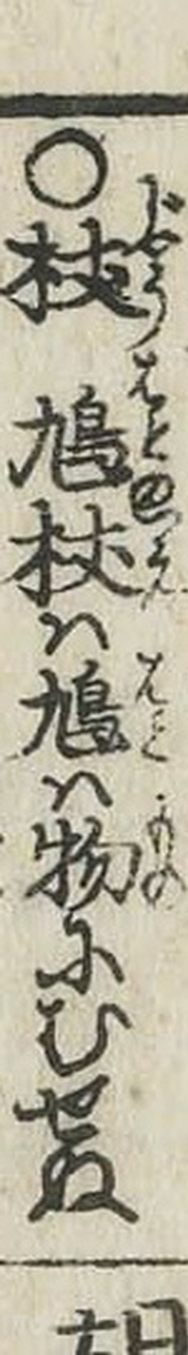○杖鳩杖は鳩は物にむせぬ
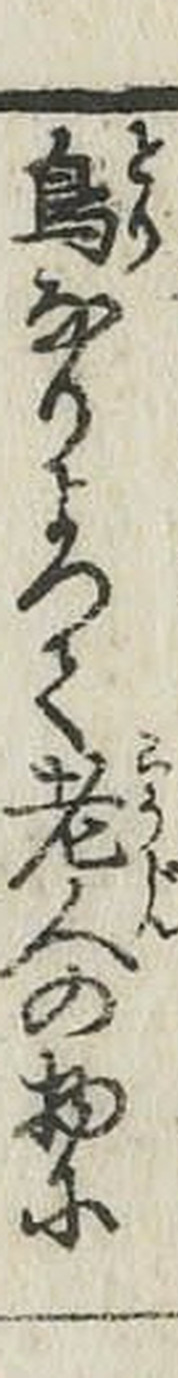鳥なりよつて老人の物に
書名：増補頭書訓蒙図彙大成 10巻 5:巻之9-11
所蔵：東京学芸大学教育コンテンツアーカイブ
